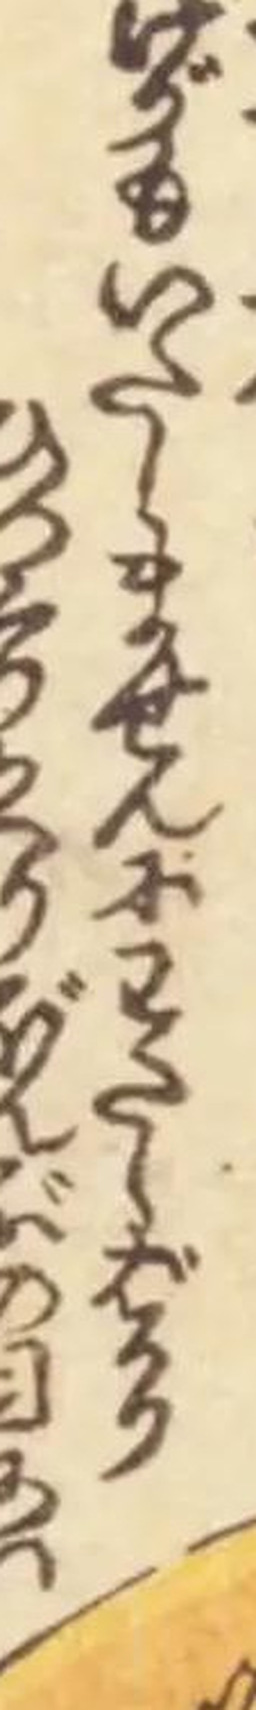ひつくりかへりぼんぶの目には
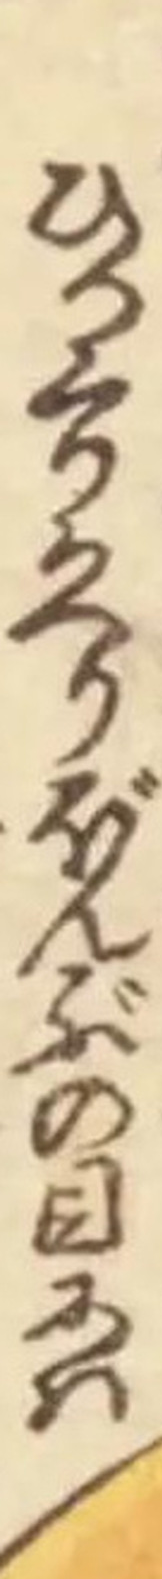ひつくりかへりぼんぶの目には
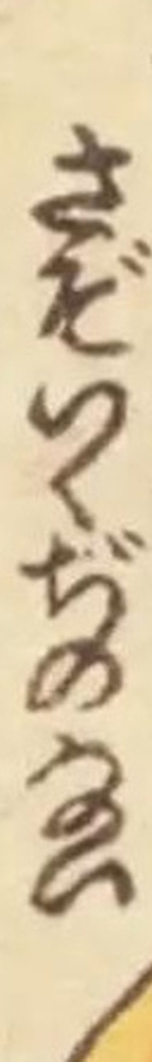さぞいくぢのない
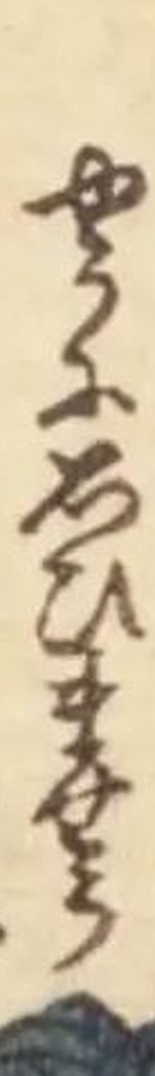やうに思ひませう
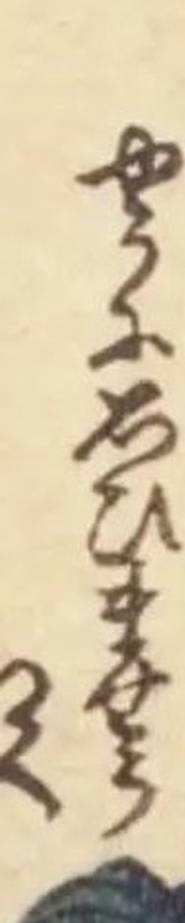やうに思ひませう
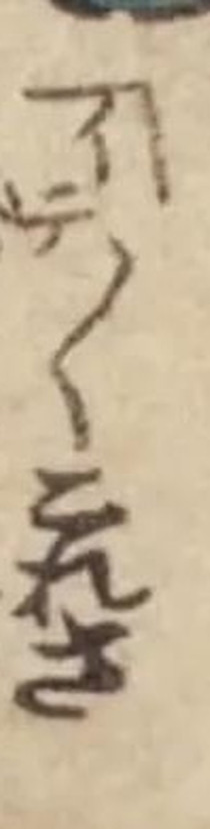「イテ〳〵これさ
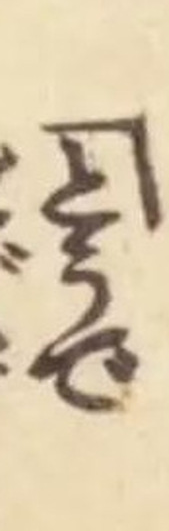「とうで
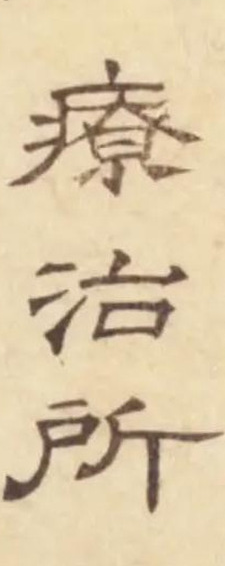療治所
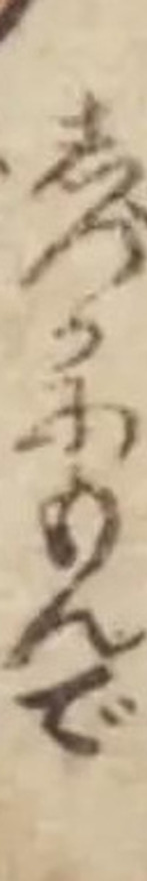しづかにもんで
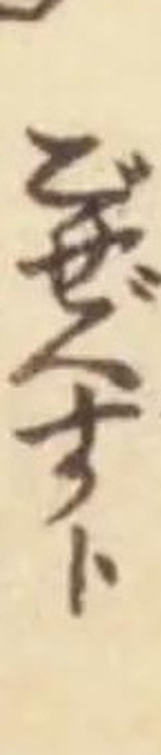ごぜへすト
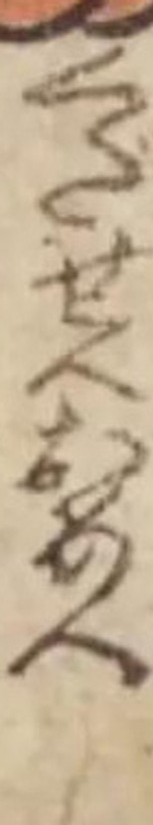くだせへおめへ
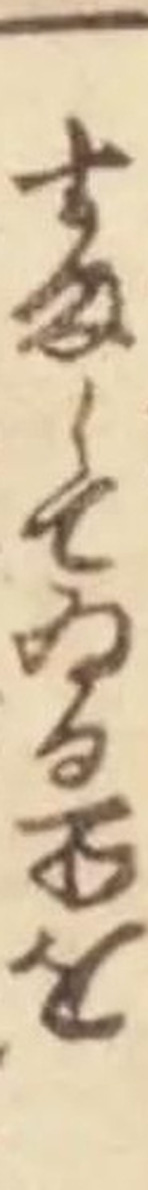すましてゐる所を
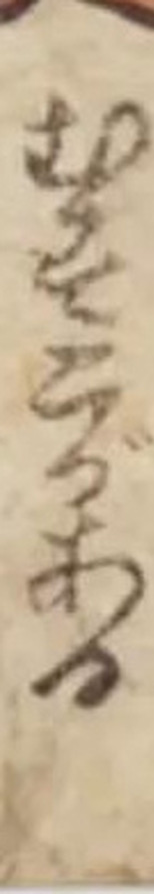むすこがある
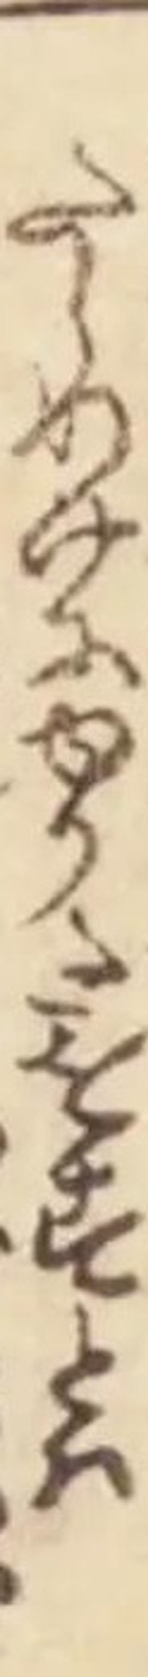たしぬけにゆりたをすとは
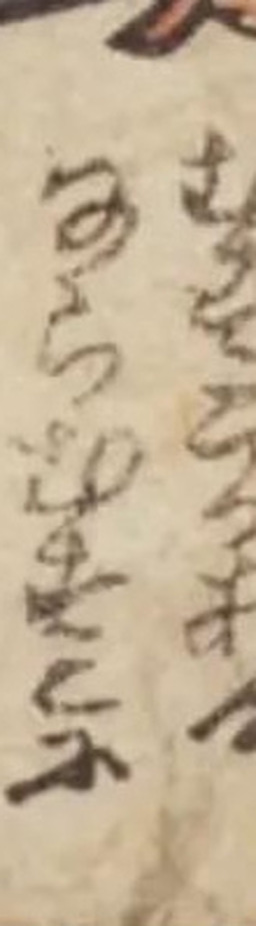ならむすこに
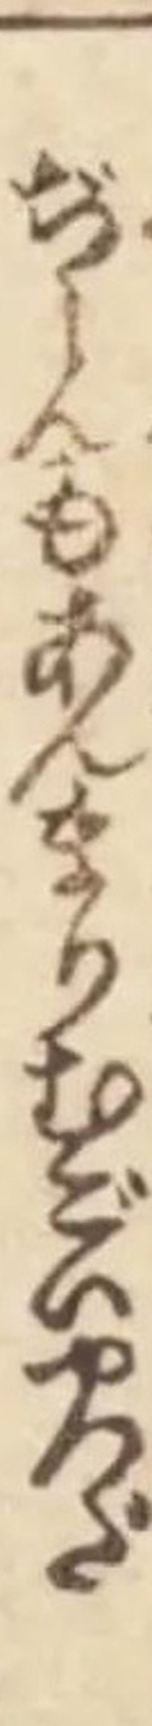ぢしんもあんまりむごいやつだ
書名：安政二年十月二日地震出火後日角力
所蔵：国立国会図書館 National Diet Library, JAPAN
